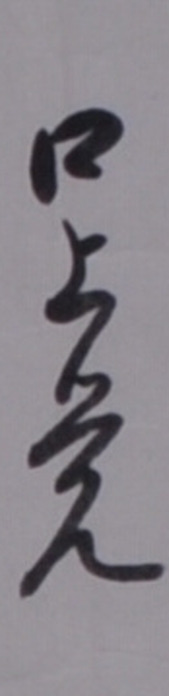口上覚
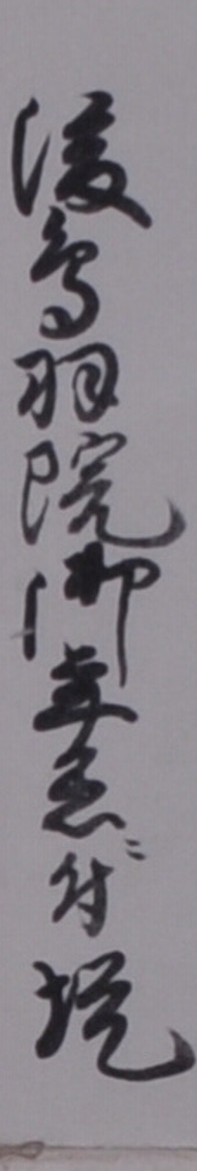後鳥羽院御年忌に付堤
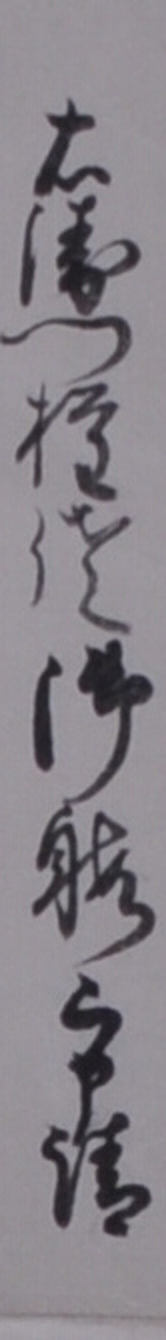右衛門権佐御暇被申請
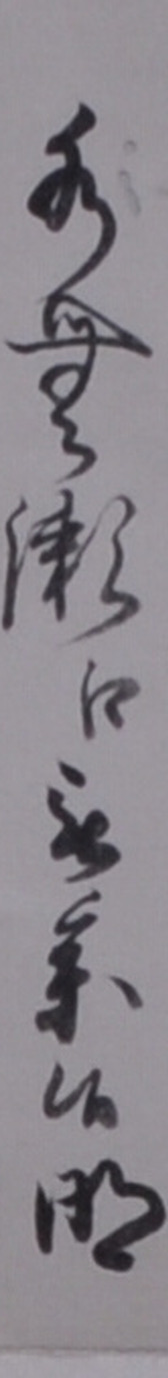水無瀬え被参候明
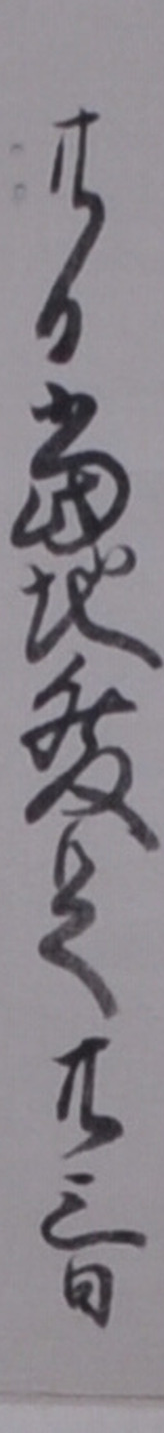廿日当地発足廿三日
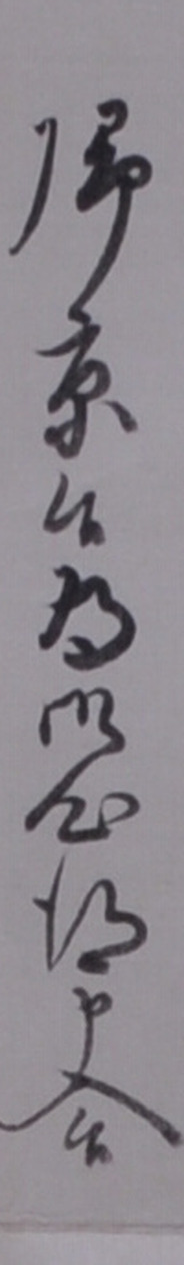帰京候為御心得申入候
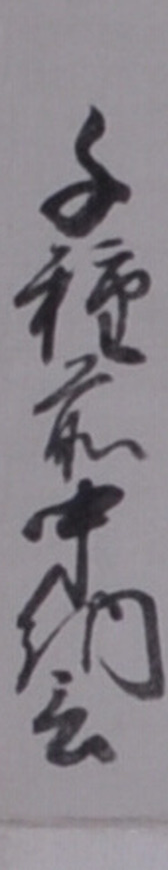千種前中納言
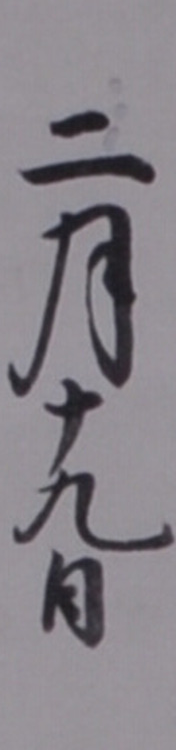二月十九日
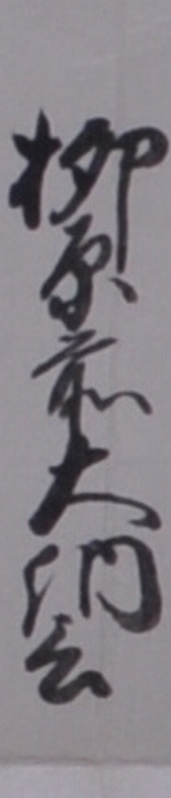柳原前大納言
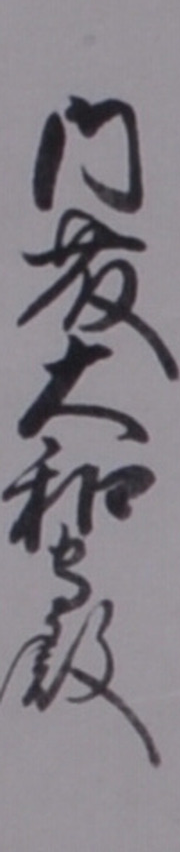内藤大和守殿
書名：口上覚
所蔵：伊那市立高遠町図書館・合同会社AMANE
